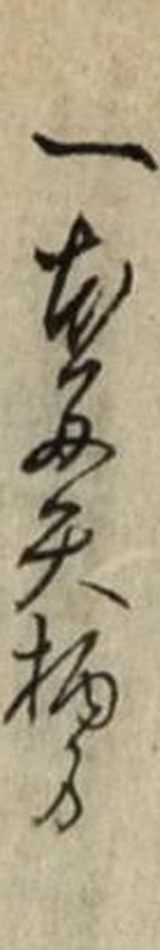一本多矢柄方
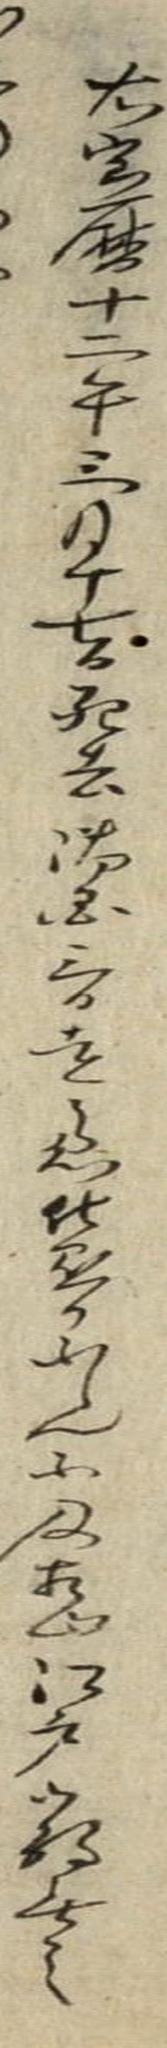右宝暦十二午三月十七日死去御国三日遠慮仕懸りふしん不及相止江戸御触無之
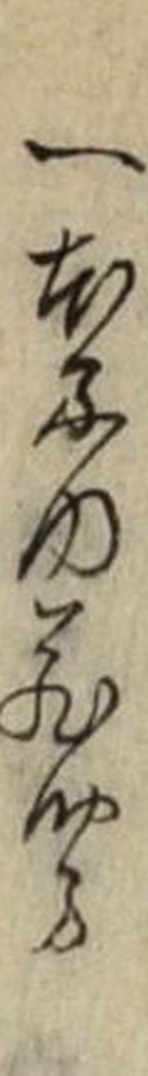一本多内蔵助方
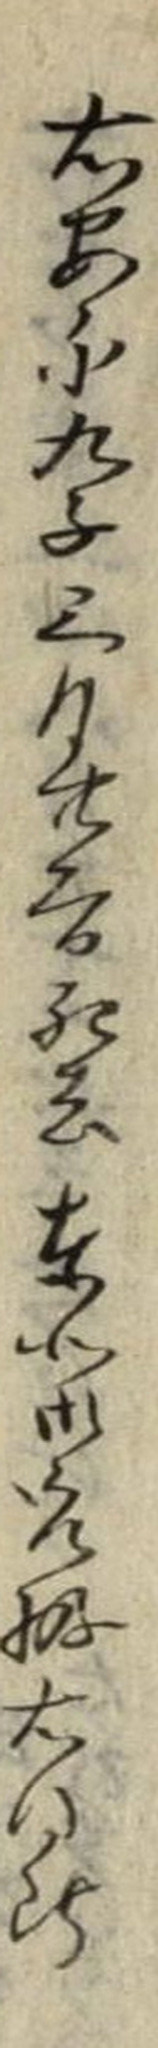右安永九子三月廿二日死去東北御取扱右同断
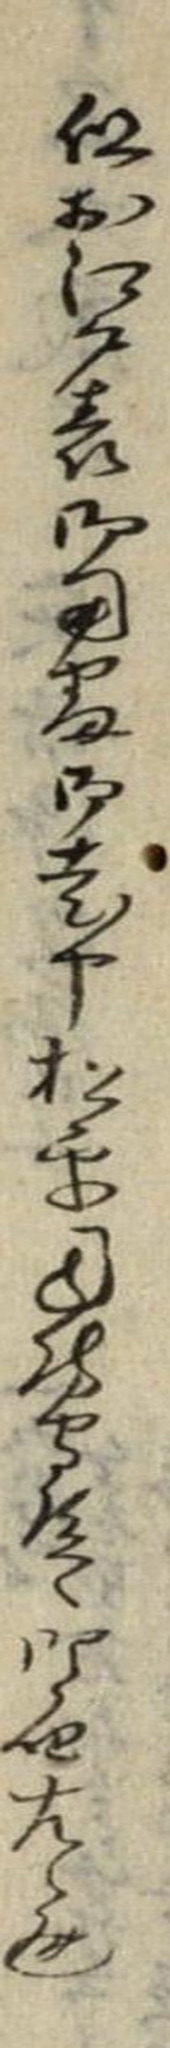但於江戸表御用番御老中松平周防守殿へ御届左之通
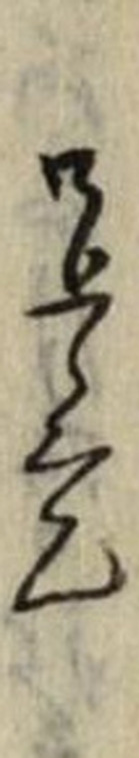口上之覚
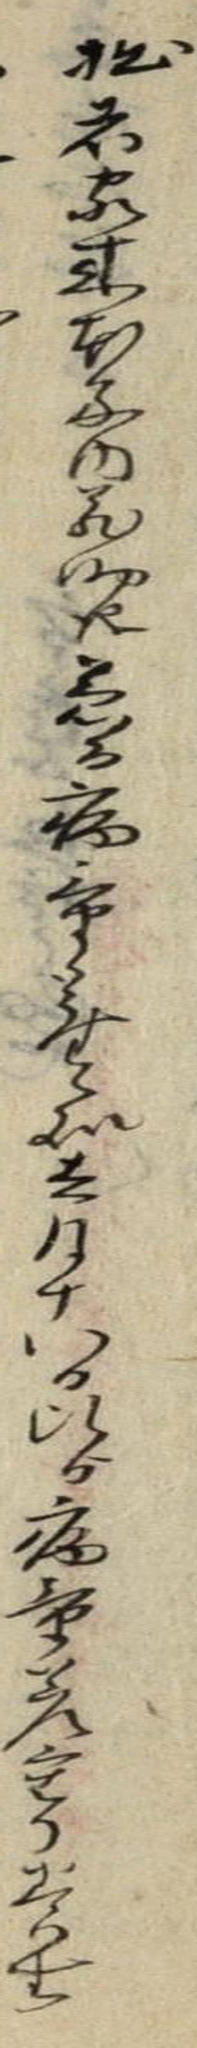拙者家来本多内蔵助儀兼て病気御座候処去月十八日頃ゟ病気差重り養生
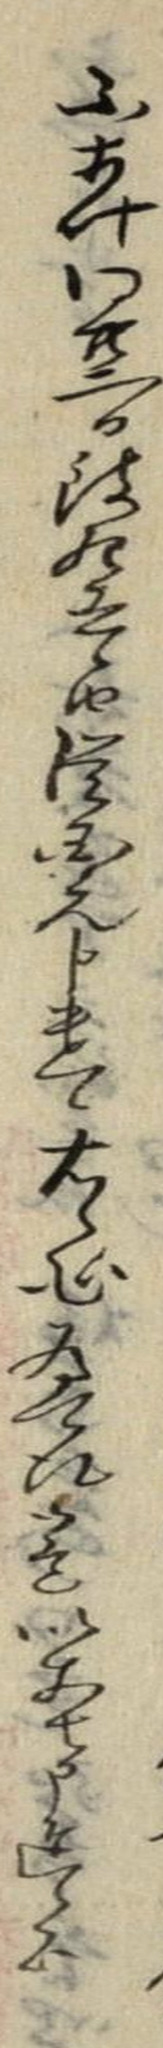不相叶同廿二日致死去候由従国元申遣候右之趣為可得御意以使者申達候以上
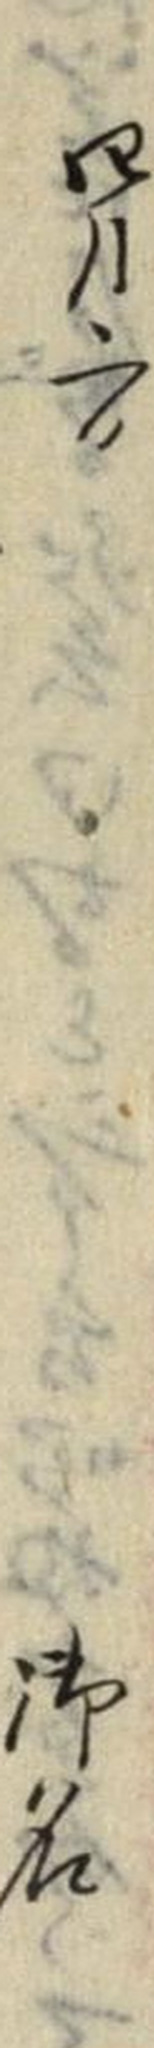四月二日御名
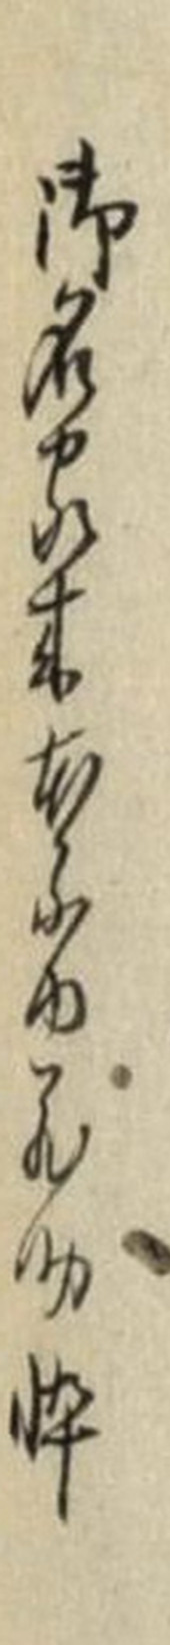別紙御名家来本多内蔵助悴
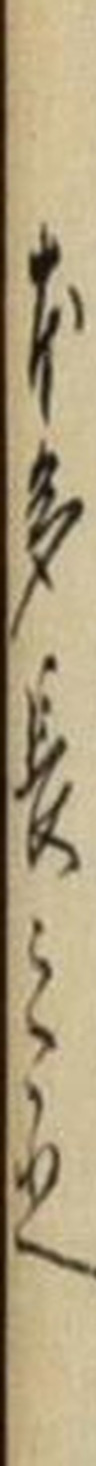本多長之丞
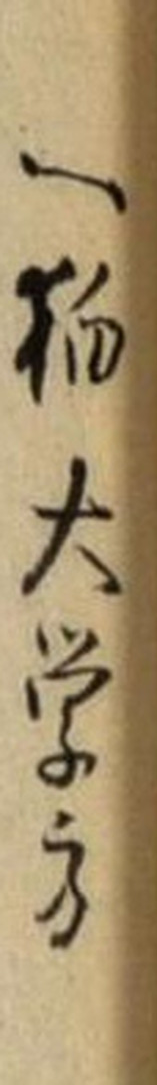一狛大学方
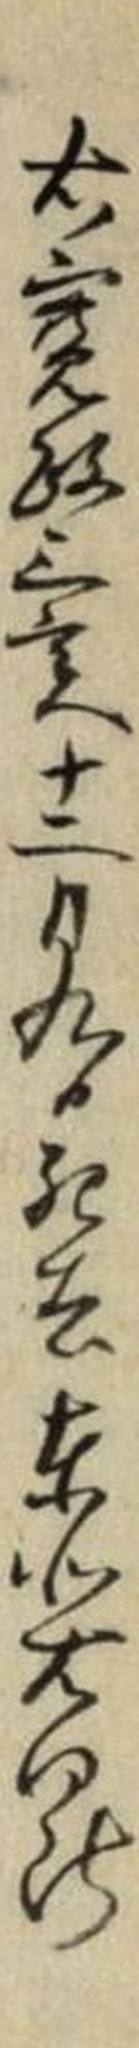右寛政三亥十二月九日死去東北右同断
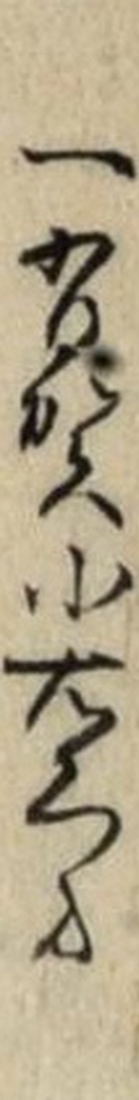一有賀小右衛門方
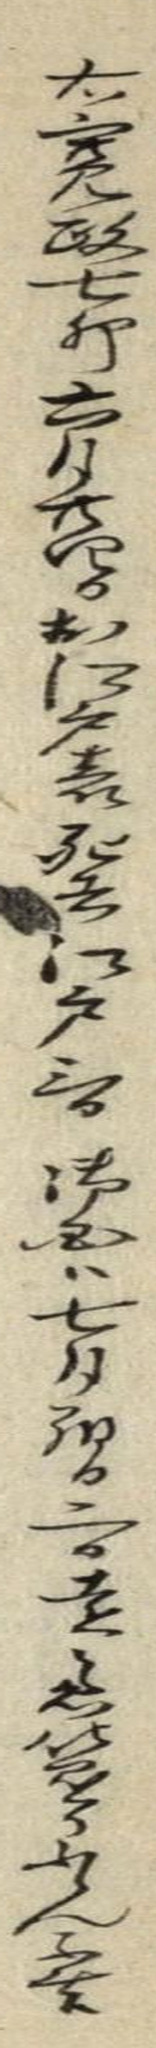右寛政七卯六月廿四日於江戸表死去江戸三日御国は七月朔日二日遠慮仕懸りふしん不苦
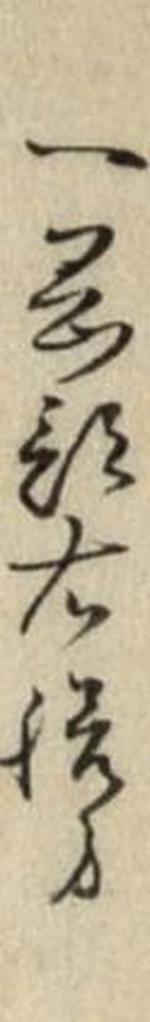一岡部右膳方
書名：御停止異変死失
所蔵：福井県文書館 Fukui Prefectural Archives
